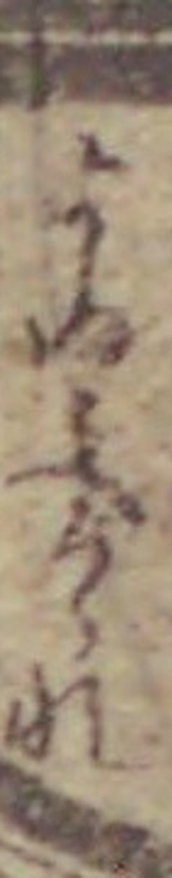よしはらへうられ
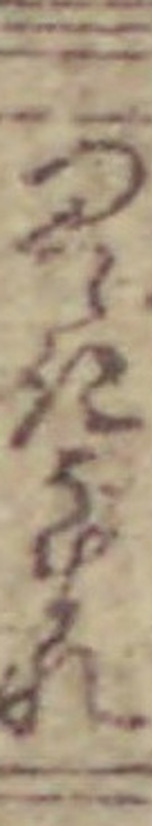つくしきうまれ
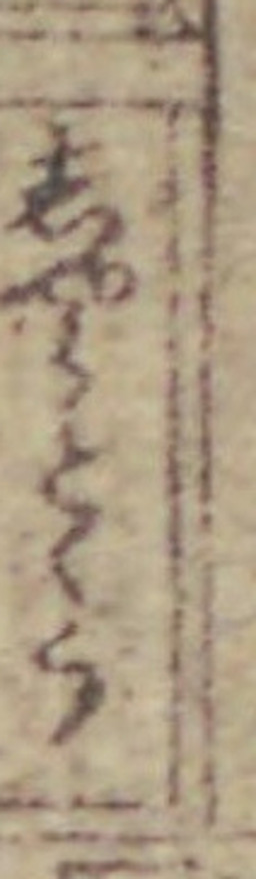しやうとくう
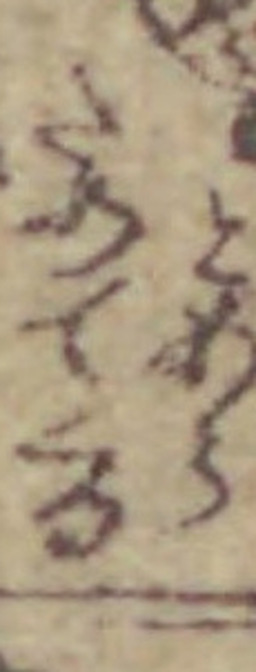ためてくる
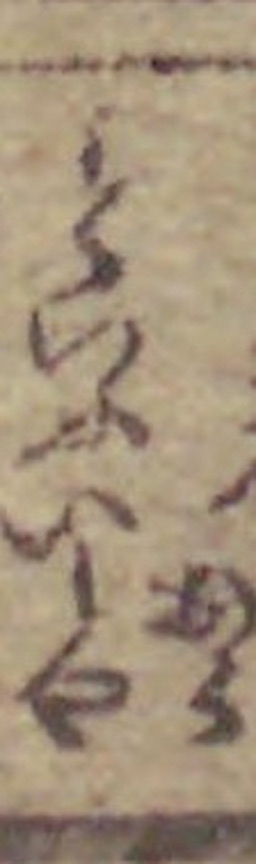といふいしや
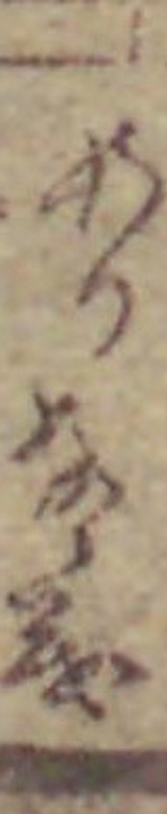ありなら茂
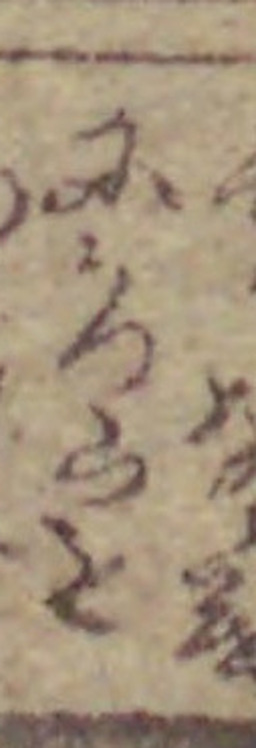にかつ山を
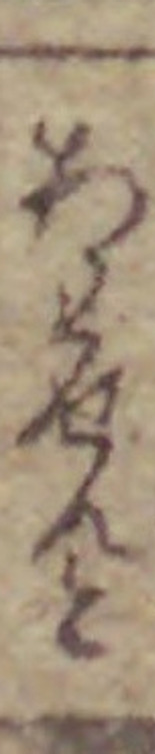あわせんと
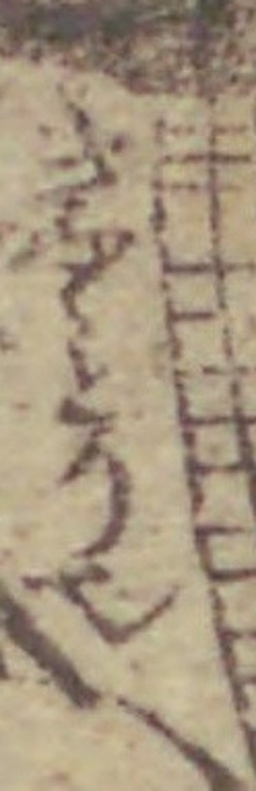きゃくとり也
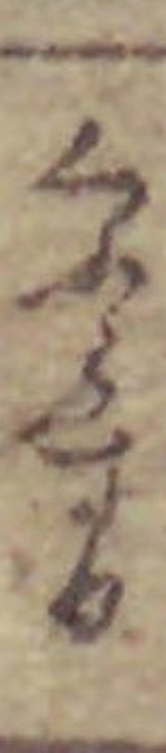くふうする
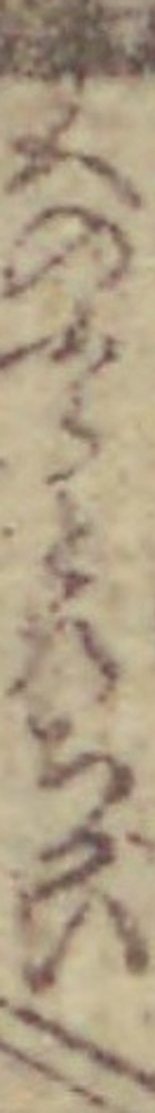人のふうとはちがい
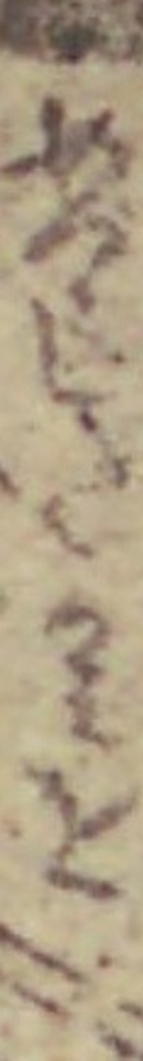めづらしきかみを
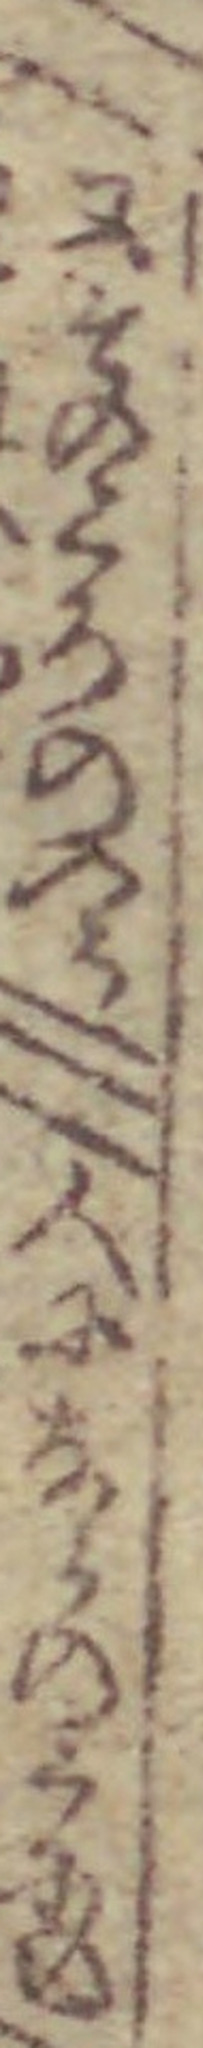又そのころのつう人にならのくに
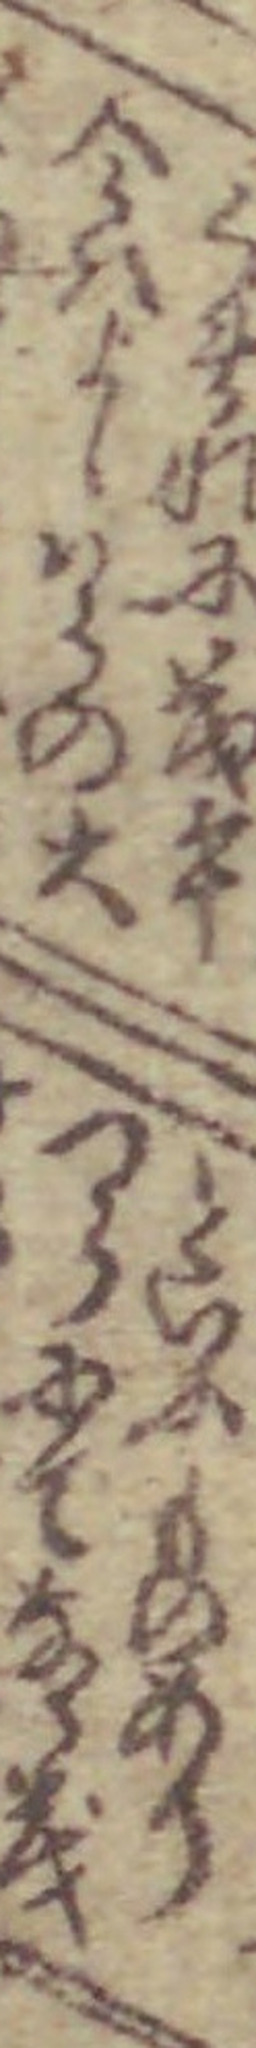今はよしはらの大つうにてなら茂
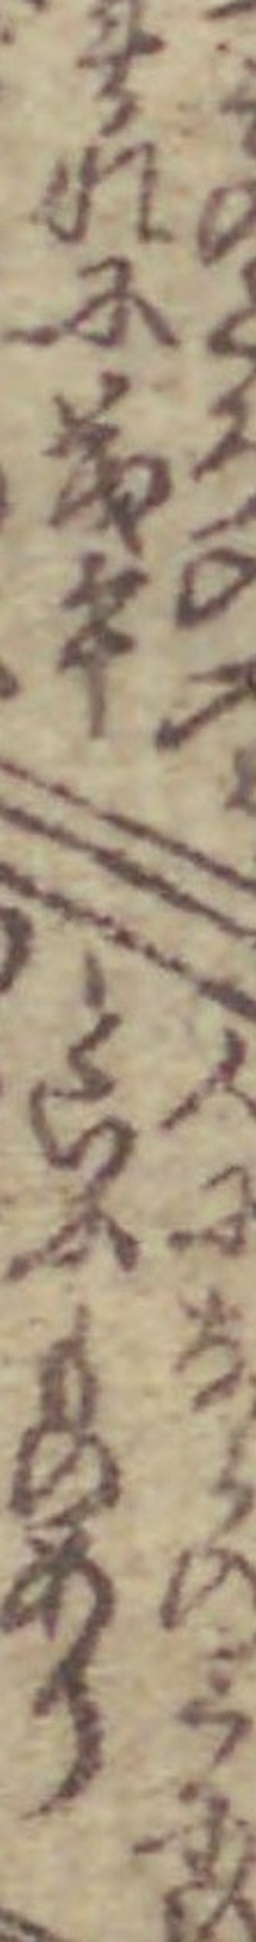うまれに茂平といふものあり
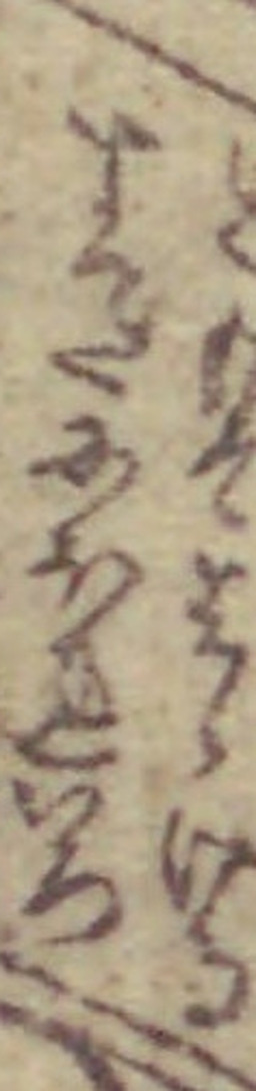すがたにほれいろ
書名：大通其面影 2巻
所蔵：国立国会図書館 National Diet Library, JAPAN
